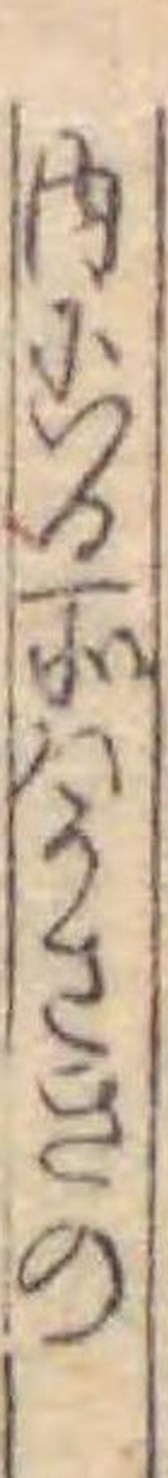内にいる所はうさきの
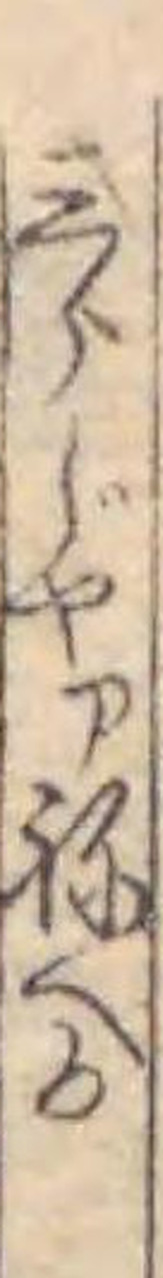三郎じやァねへか
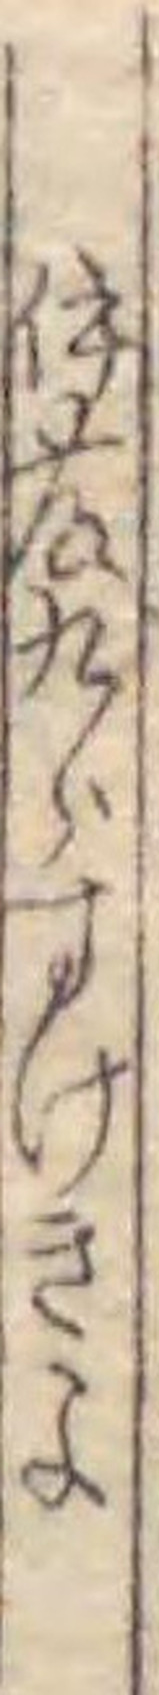伊藤九郎すけきよ
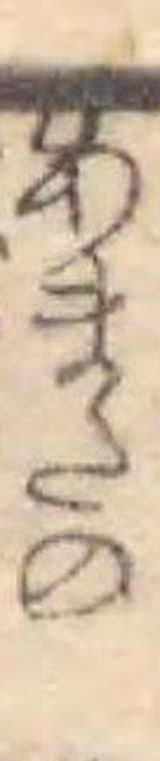あまたの
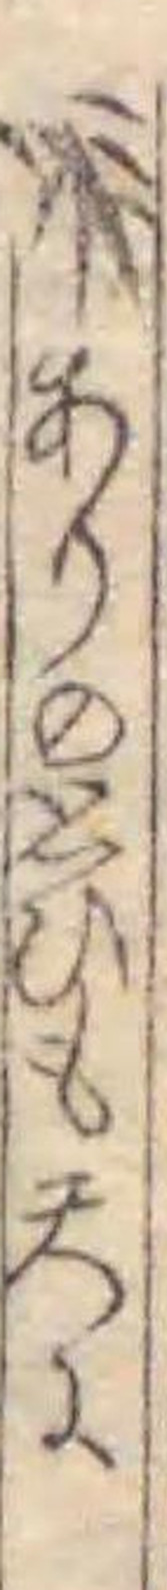ありの思ひも天に
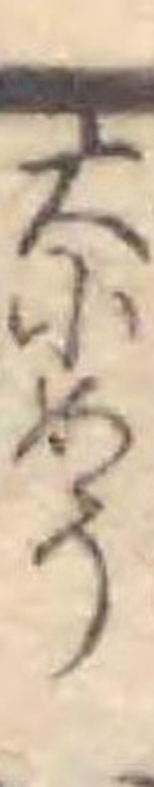大小めう
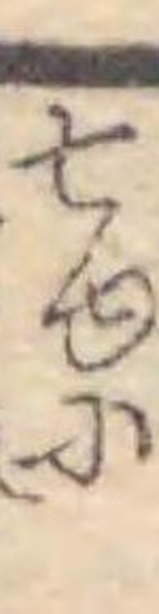七ゆに
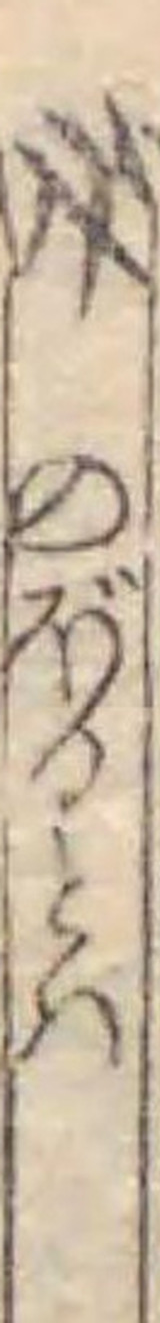のぼるとは
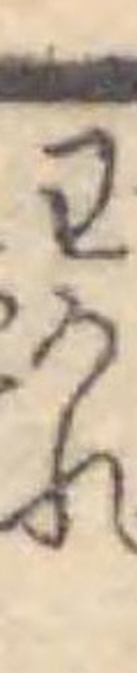わかれ
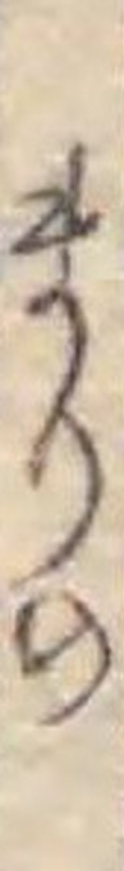まりの
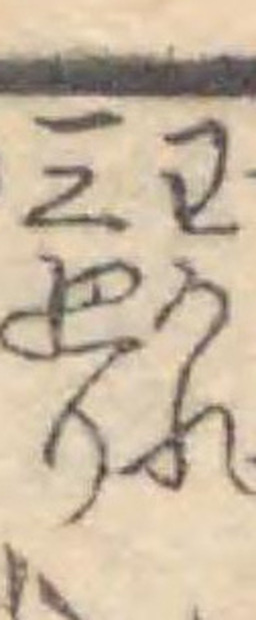三廻り
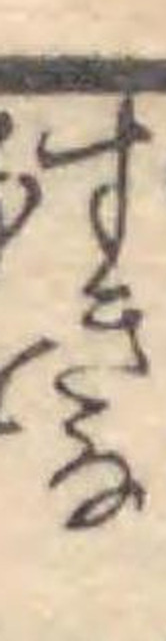すきな
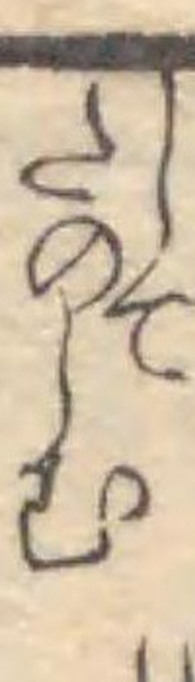たのしむ
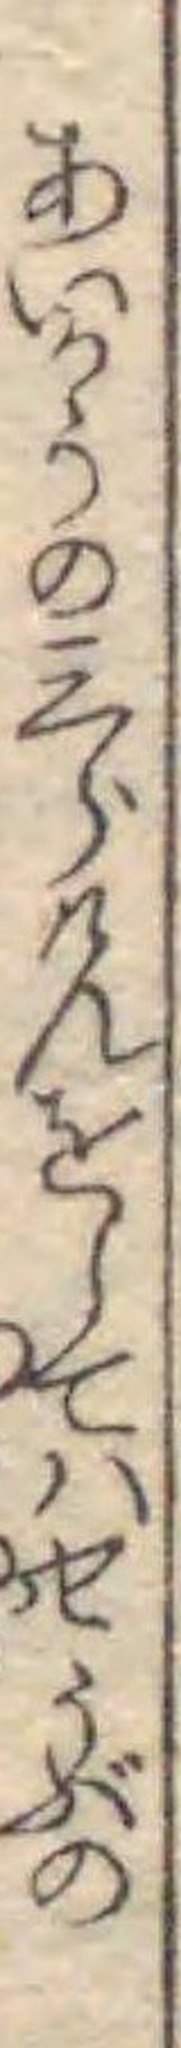あいかうの三郎けんをしてはせうぶの
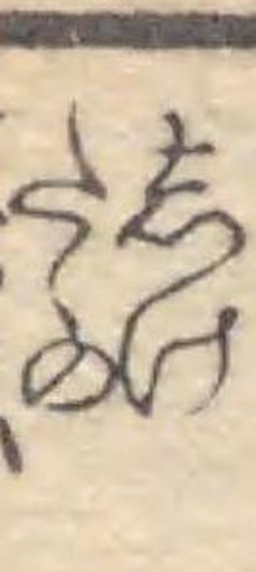たゝの
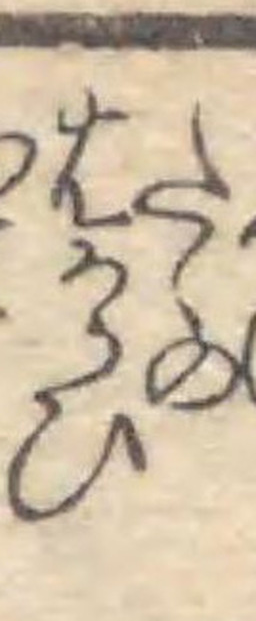はからひ
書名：文武二道万石通 : 3巻
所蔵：国立国会図書館 National Diet Library, JAPAN
